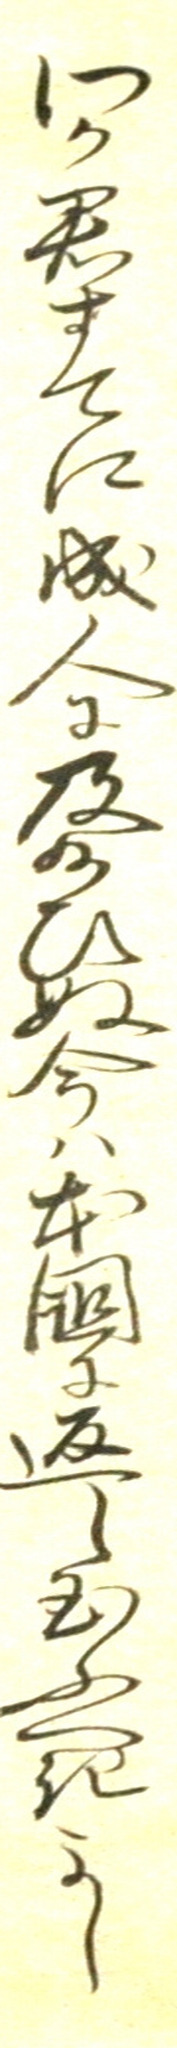わか君すてに成人に及給ひぬ今は本国に返し玉ふへきよし
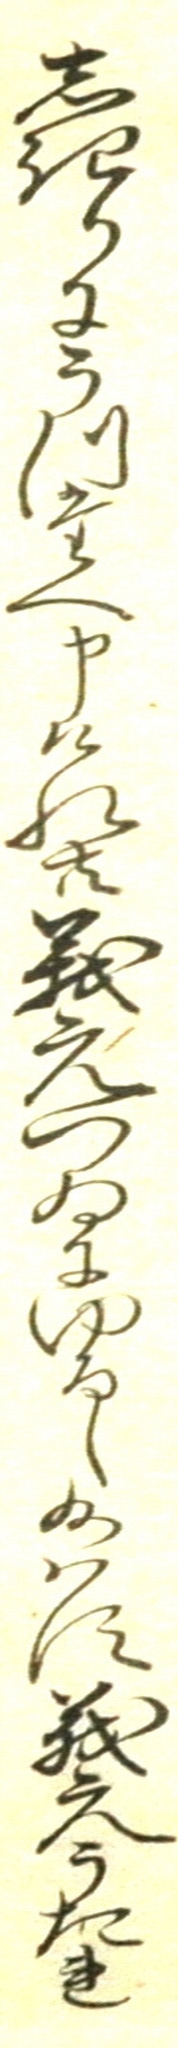しきりにうつたへ申けれ共義元つゐにゆるし給はす義元うたれ
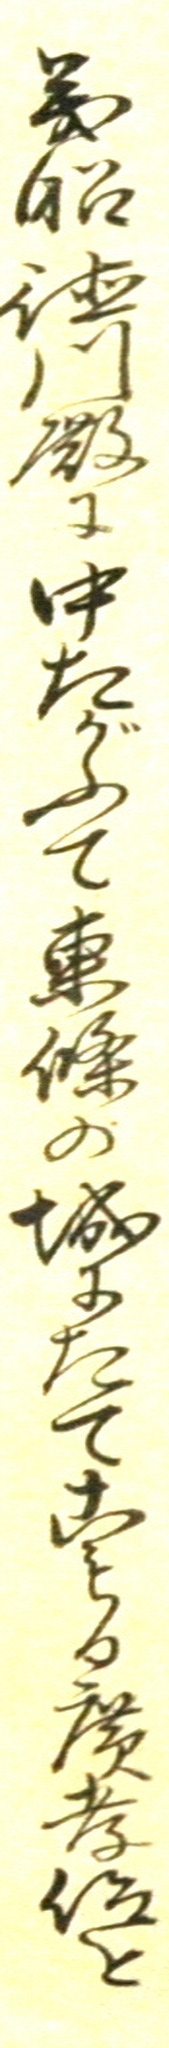義昭徳川殿に中たがふて東条の城にたてこもる廣孝仰を

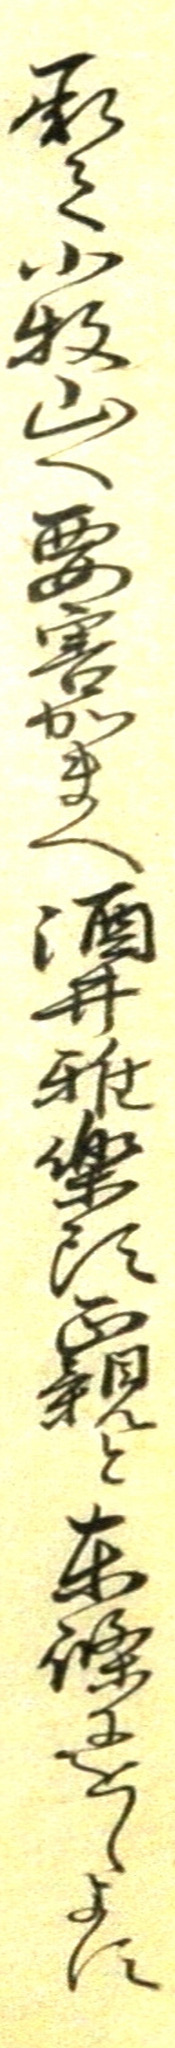承て小牧山へ要害かまへ酒井雅楽頭正親と東条にをしよす
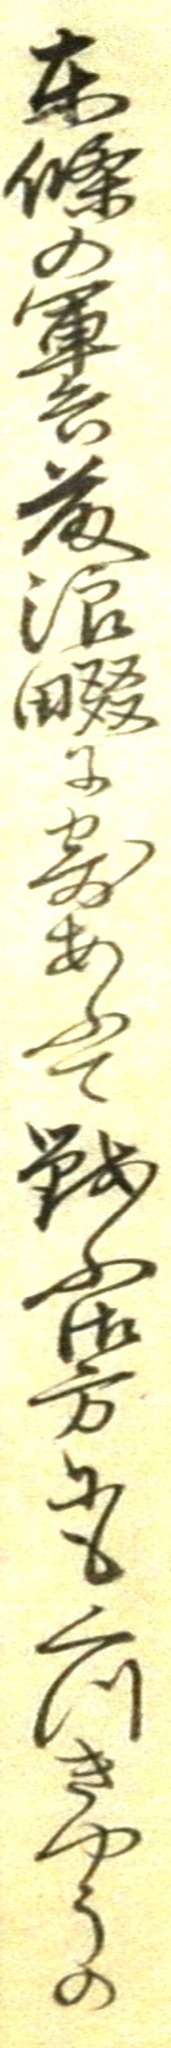東条の軍兵藤浪畷に寄あふて戦ふ御方にもくつきやうの
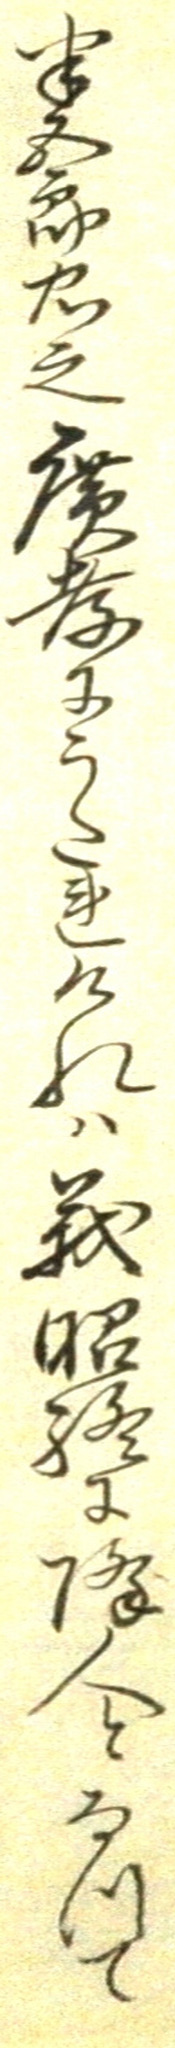半五郎忠元廣孝にうたれけれは義昭終に降人となつて
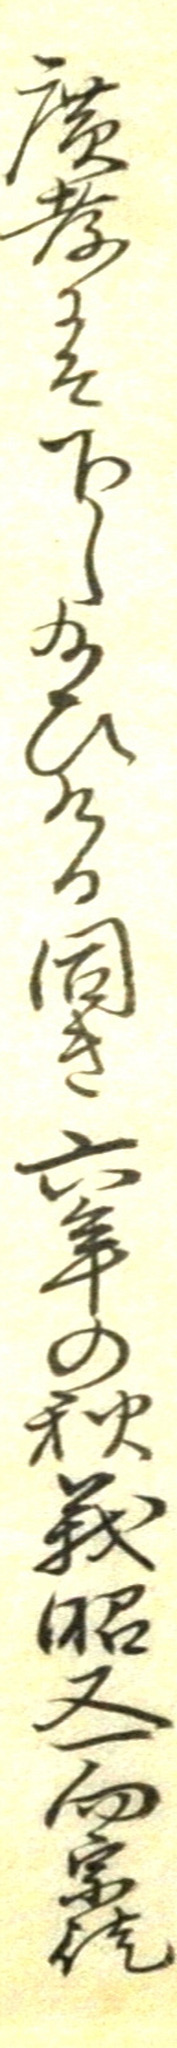廣孝にそ下し給ひける同き六年の秋義昭又一向宗徒
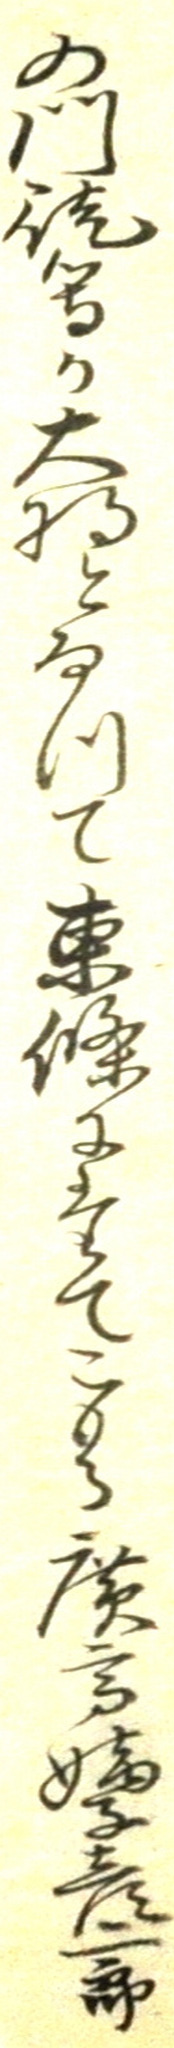の門徒等か大将となつて東条にたてこもる廣孝嫡子彦二郎
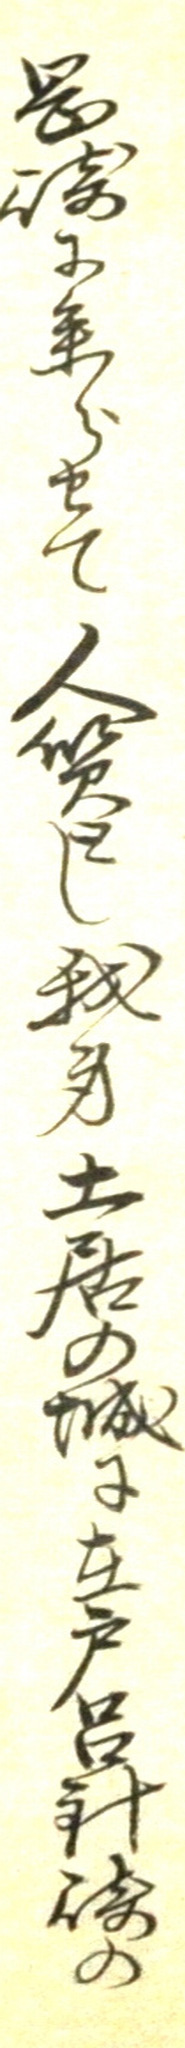岡崎に参らせて人質とし我身土居の城に在戸呂針崎の
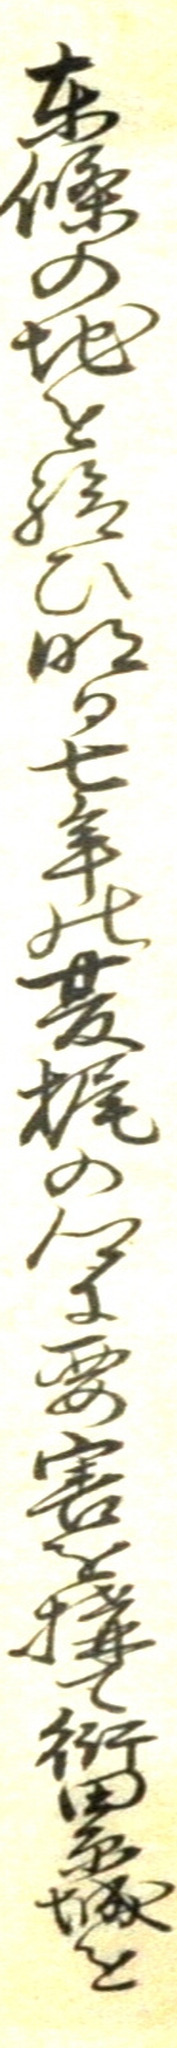東条の地を給ひ明る七年の夏梶の郷に要害を構て衍田原城を
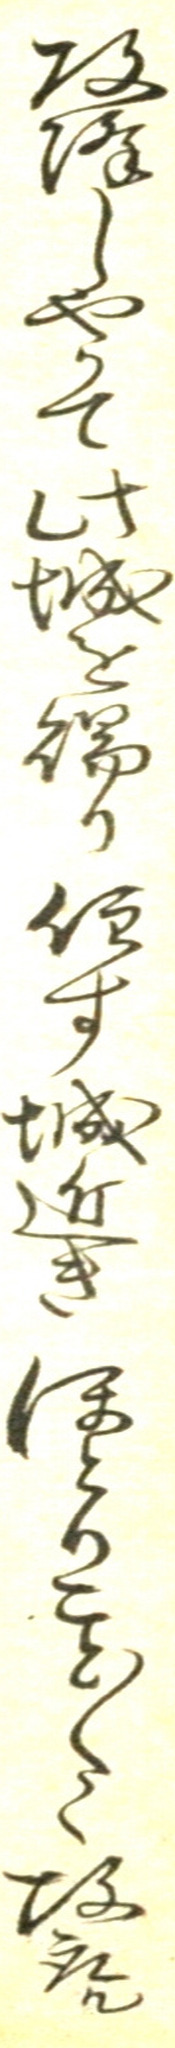攻降しやかて此城を賜り住す城近きほとりこと〳〵く攻め取ル
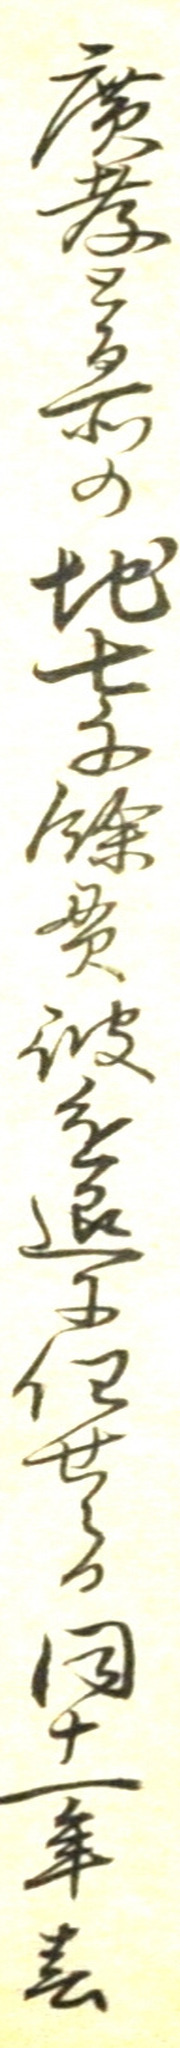廣孝とる所の地七千余貫彼進退に任せらる同十一年春
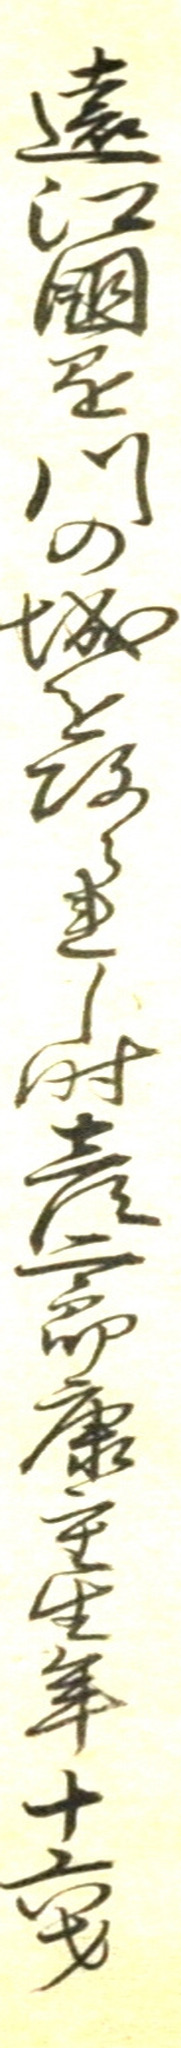遠江国懸川の城を攻られし時彦二郎康重生年十六才
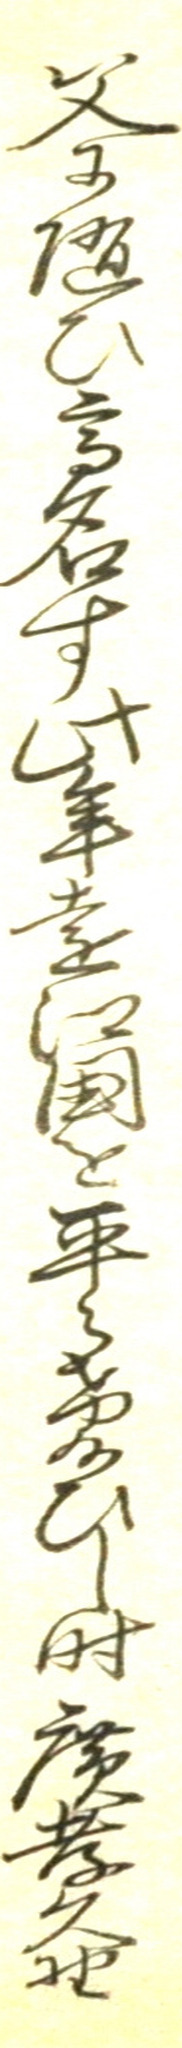父に随ひ高名す此年遠江国を平らけ給ひし時廣孝久野
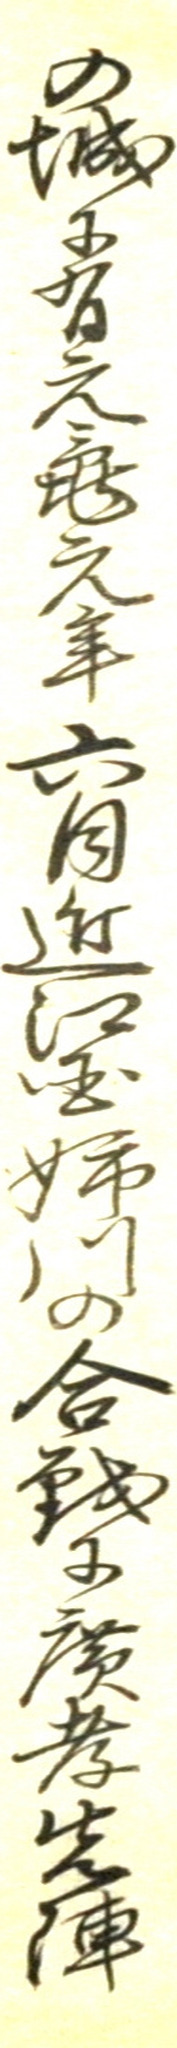の城に有元亀元年六月近江国姉川の合戦に廣孝先陣
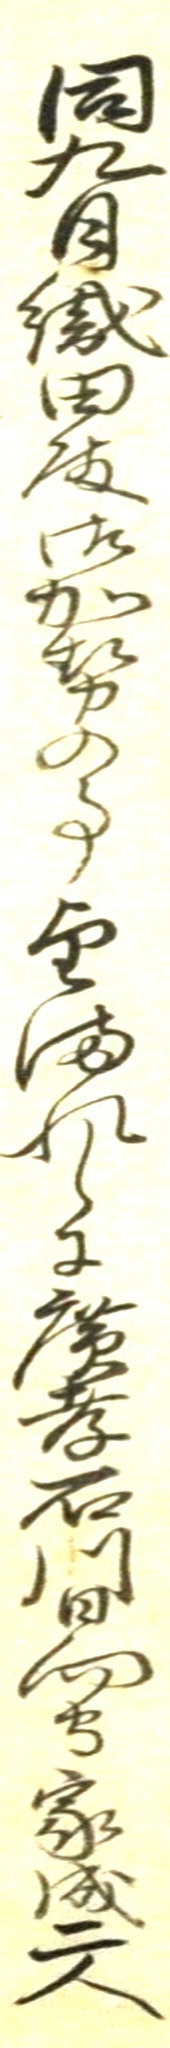同九月織田殿御加勢の事望まれしに廣孝石川日向守家成二人
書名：藩翰譜（四・上）
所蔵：伊那市立高遠町図書館・合同会社AMANE
